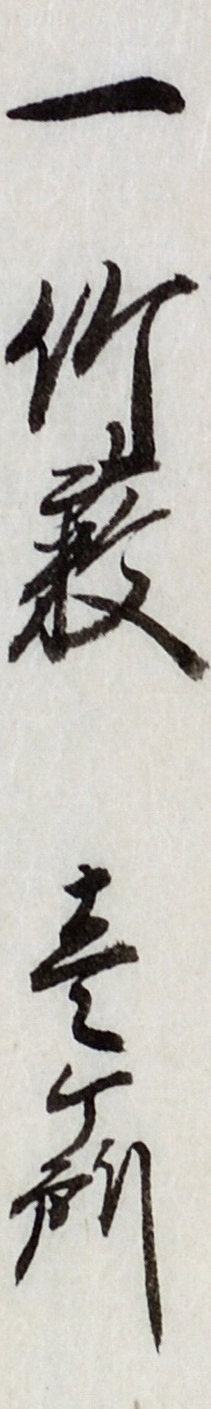一竹藪壱ケ所
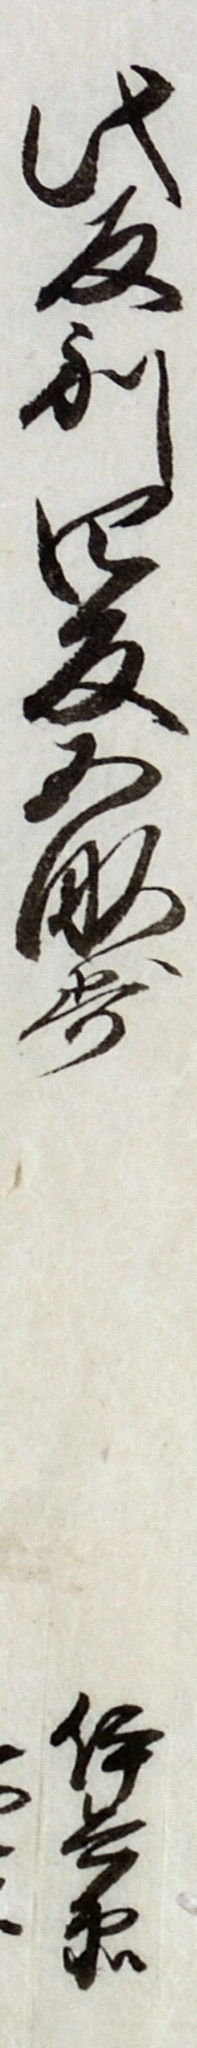此反別四反五畝歩伊兵衛
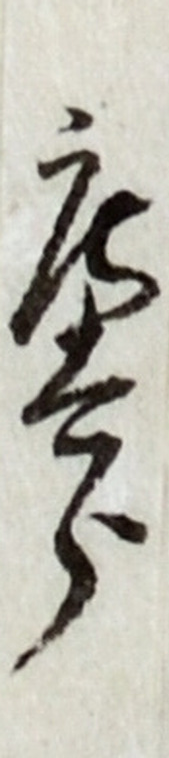庄太郎

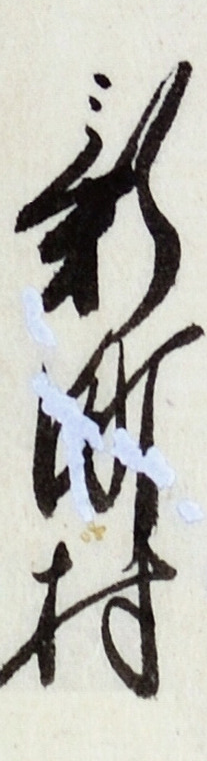新町村
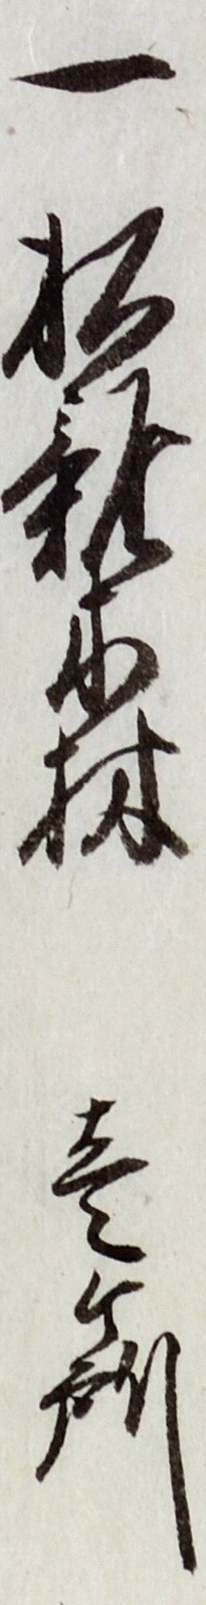一松雑木林壱ケ所
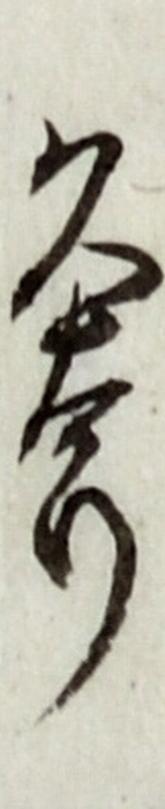久右衛門
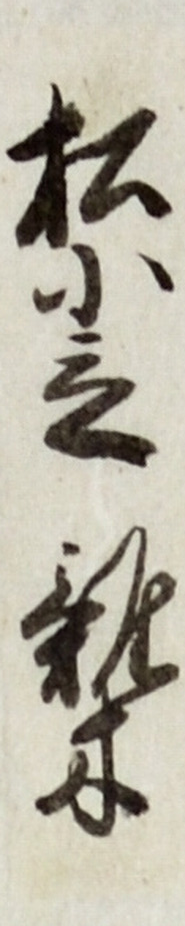松小立雑木

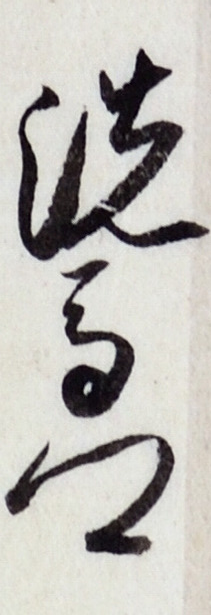洗馬郷
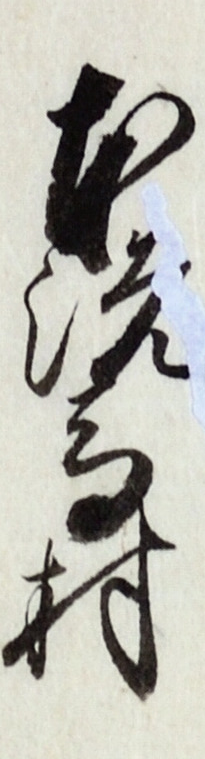本洗馬村
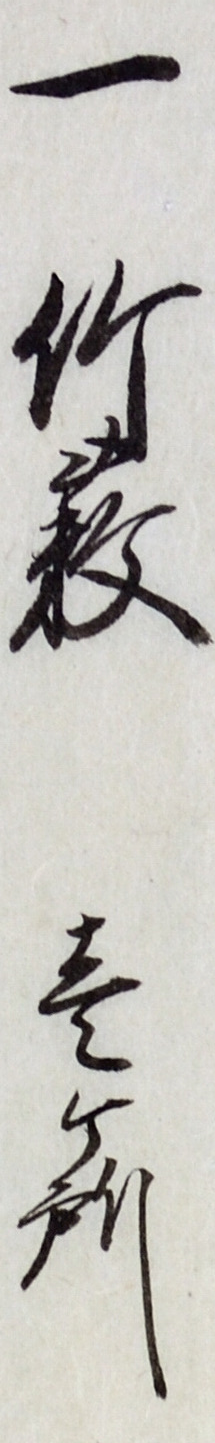一竹藪壱ケ所
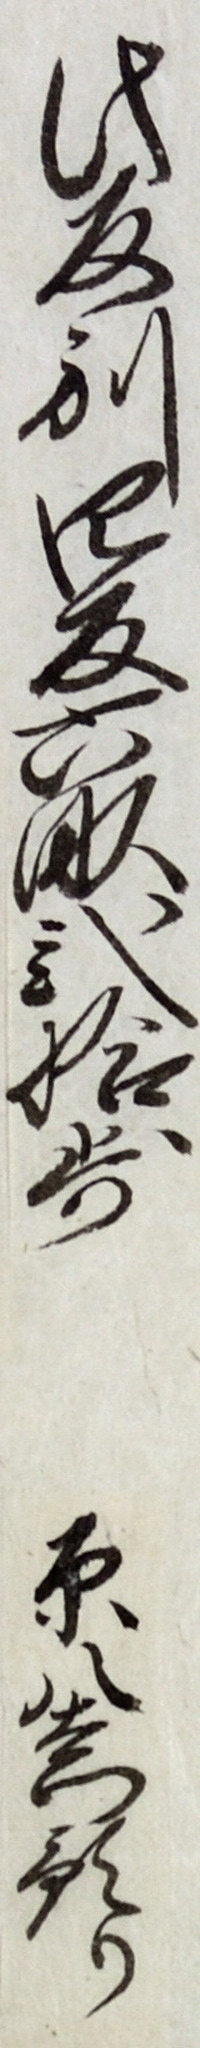此反別四反六畝弐拾歩原八右衛門預り
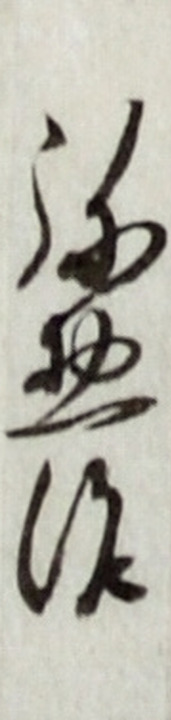弥惣治

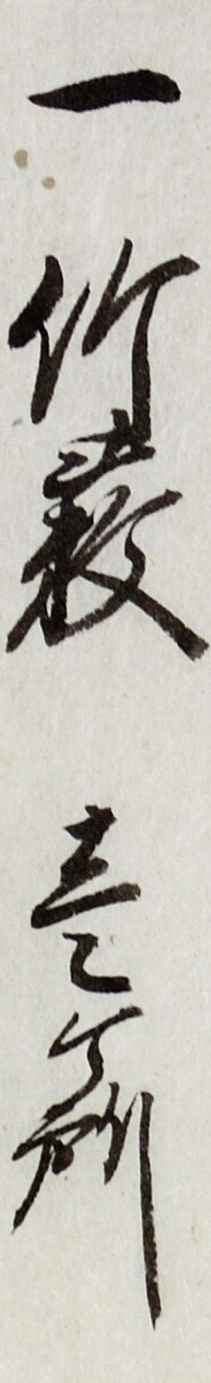一竹藪壱ケ所
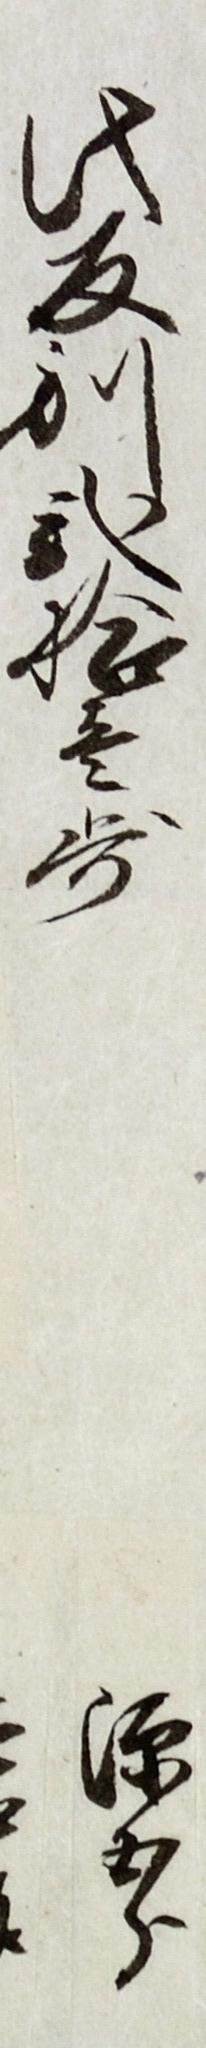此反別弐拾壱歩源五郎
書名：御領分中御林御藪附帳
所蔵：伊那市立高遠町図書館・合同会社AMANE
